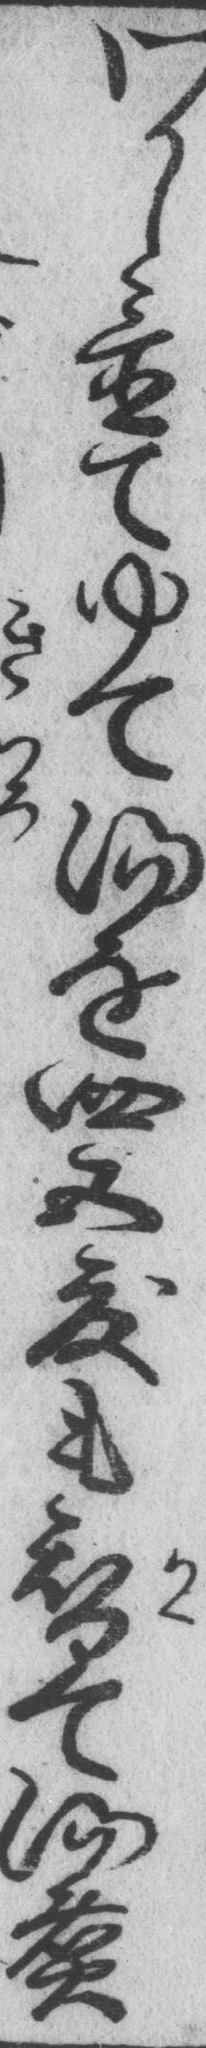わかし置てゆて湯を四五度も替て湯煮
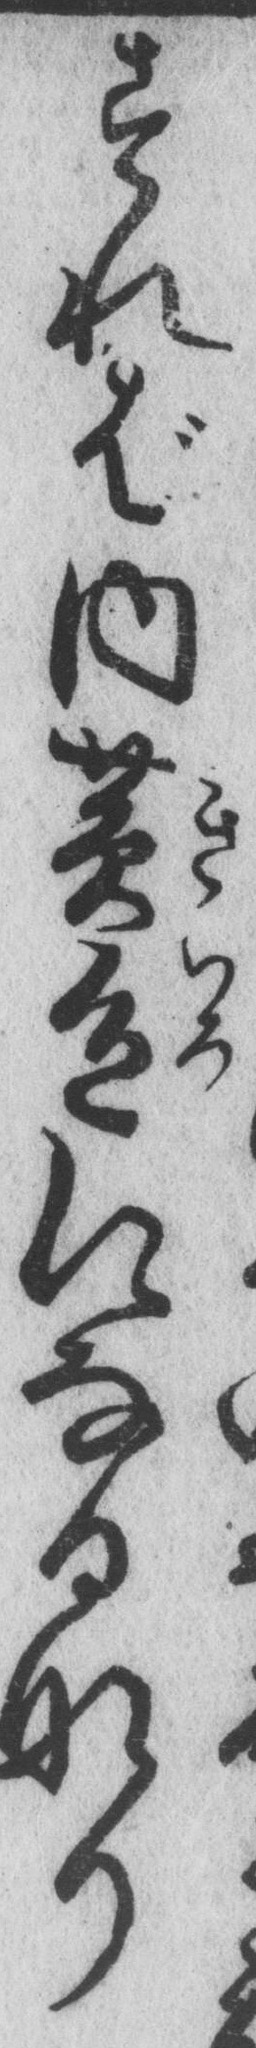すれば内黄色になるなり
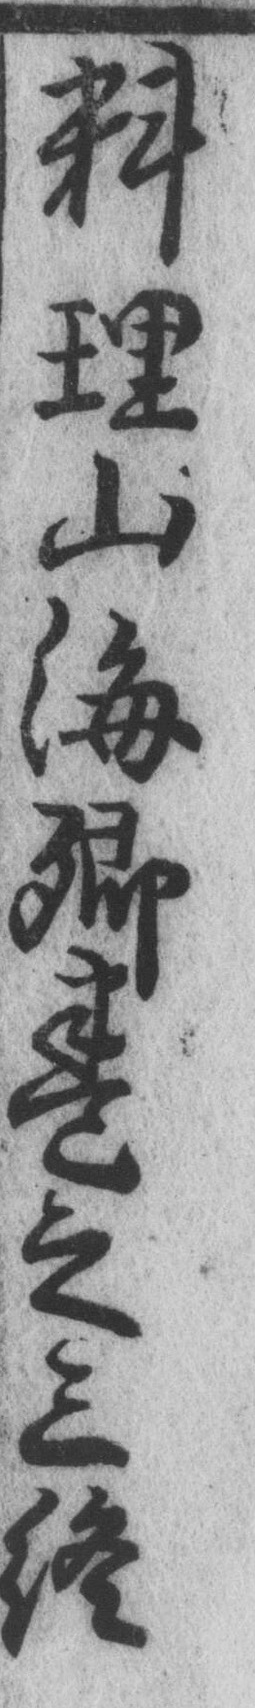料理山海郷巻之三終

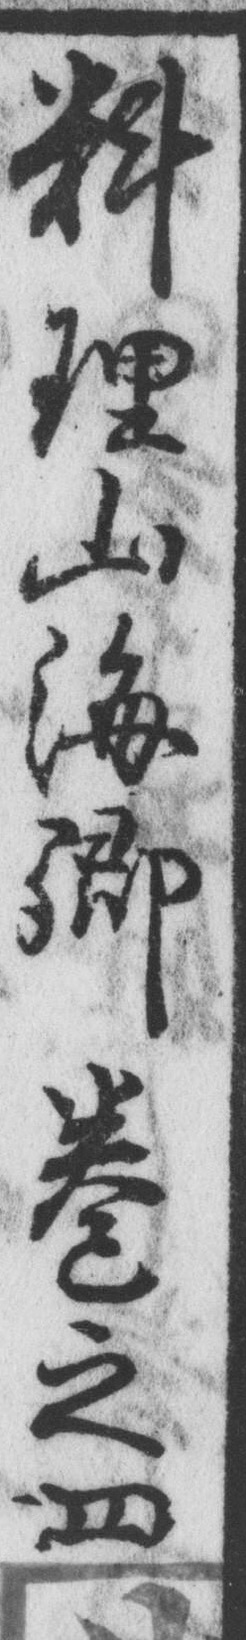料理山海郷巻之四
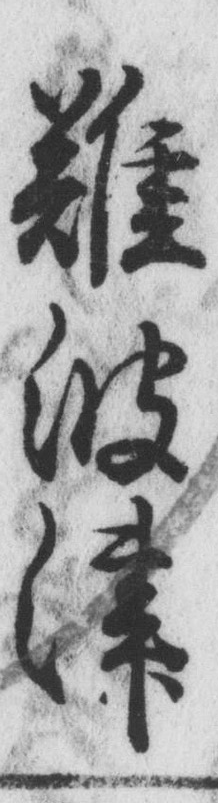難波津
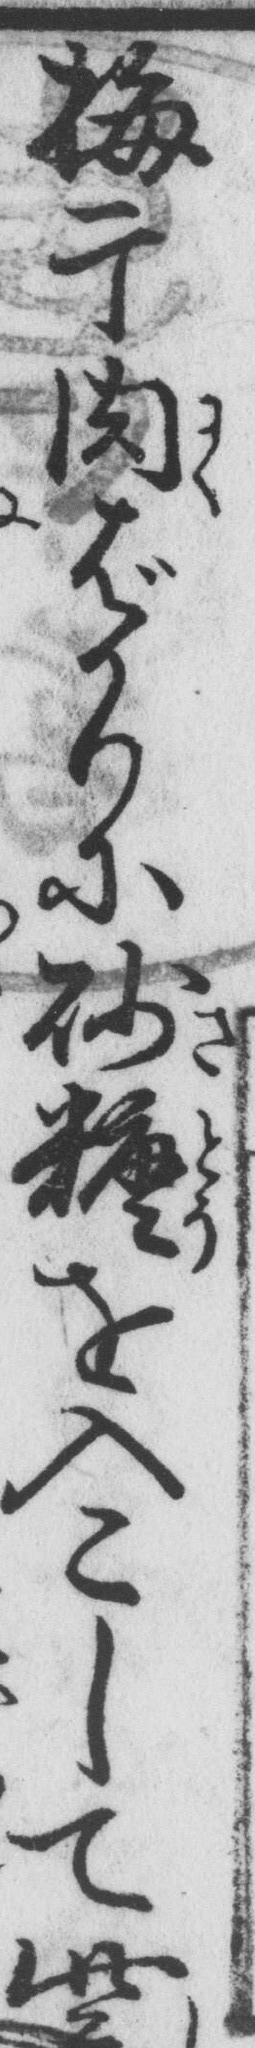梅干肉ばかりに砂糖を入こして紫蘇
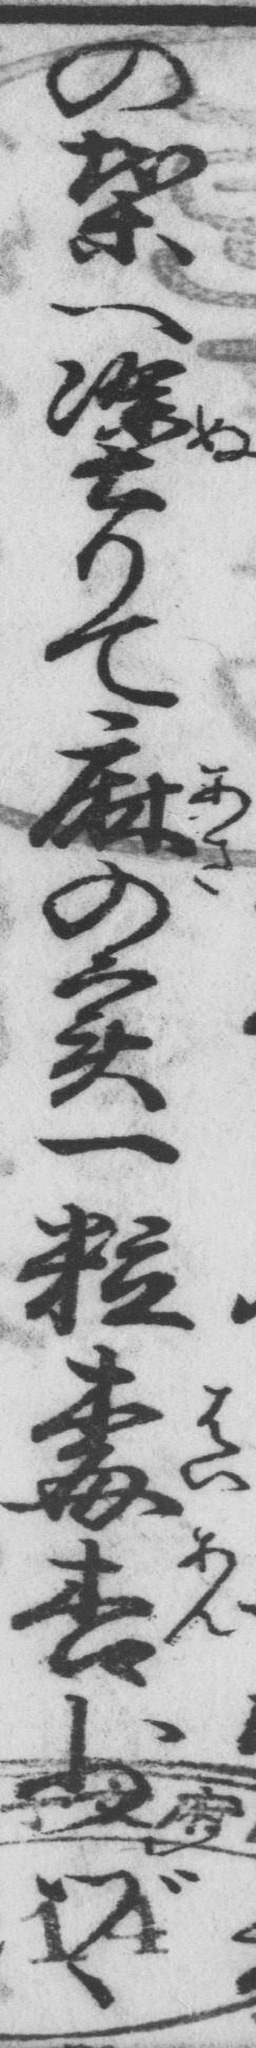の葉へ塗りて麻の実一粒梅杏少ヅヽ
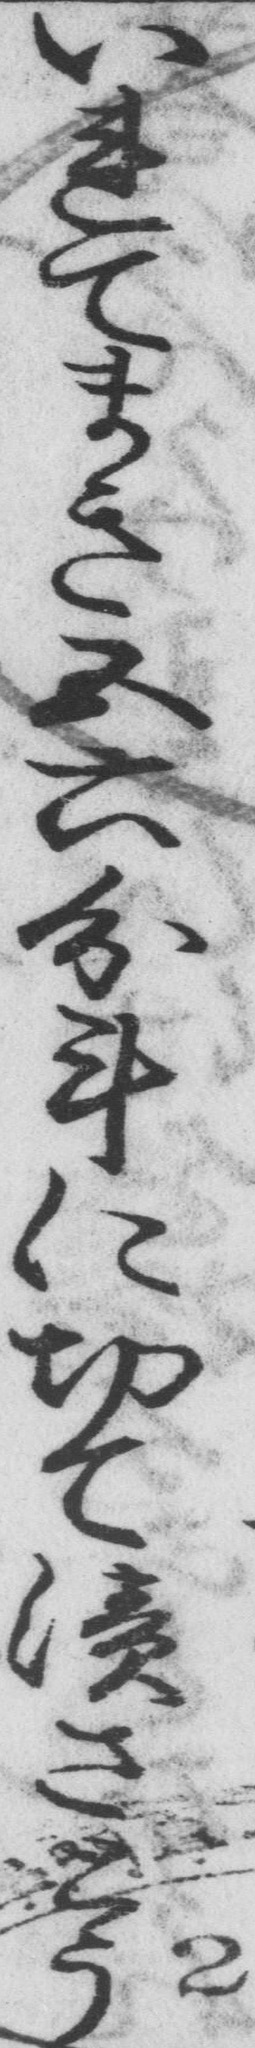いれてまき五六分斗に切て漬さとう
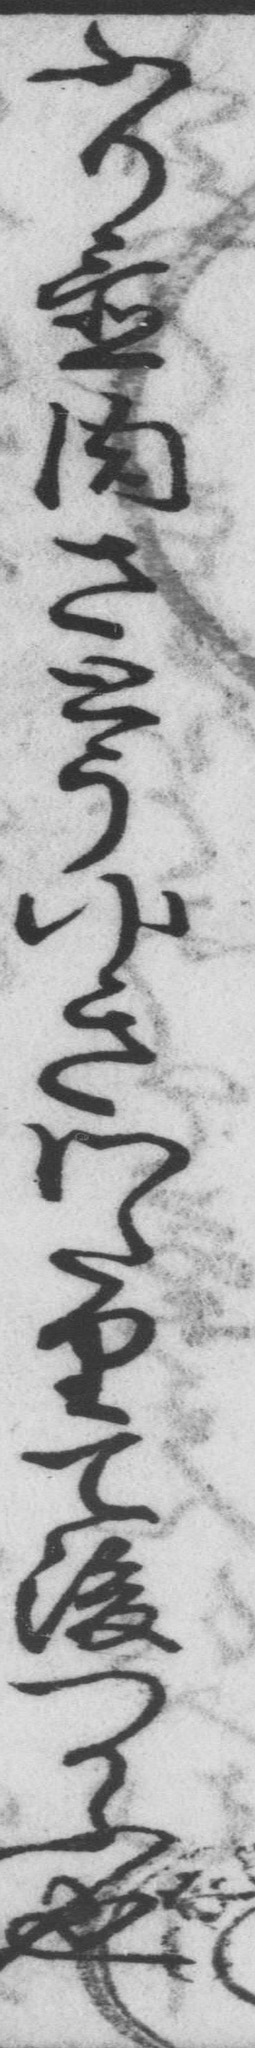ふり置肉さとうゆきわたりて後つかふ也
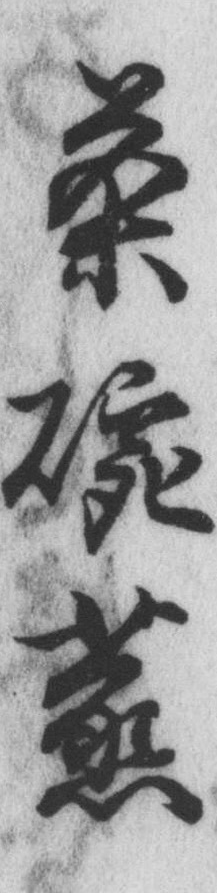茶碗蒸

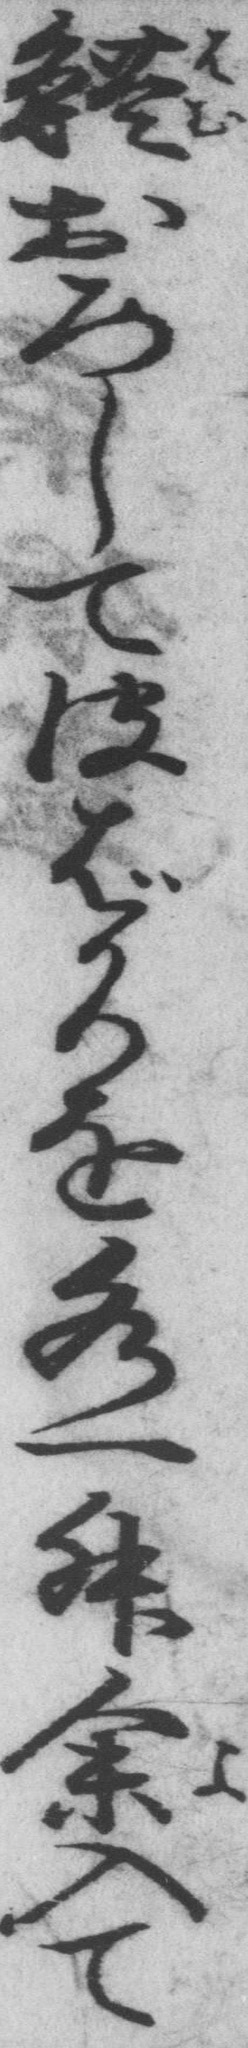鱧おろして皮ばかりを水一升余入て
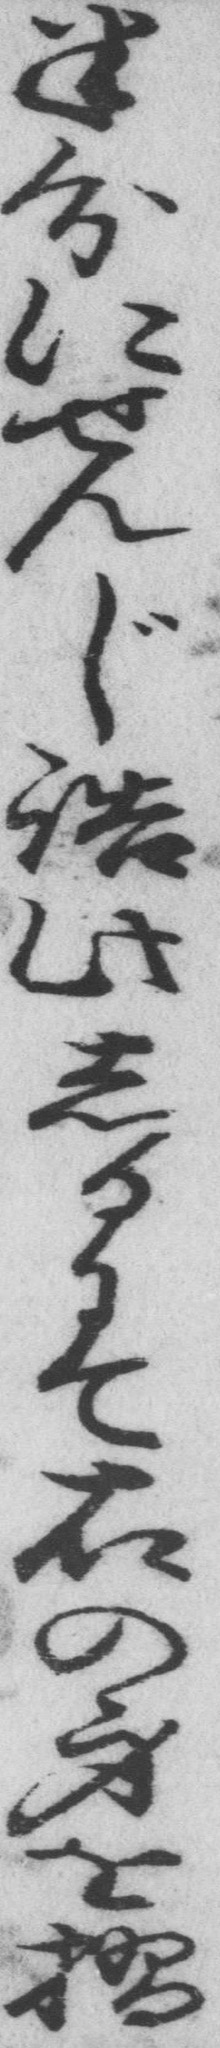半分にせんじ詰此しるにて右の身を摺
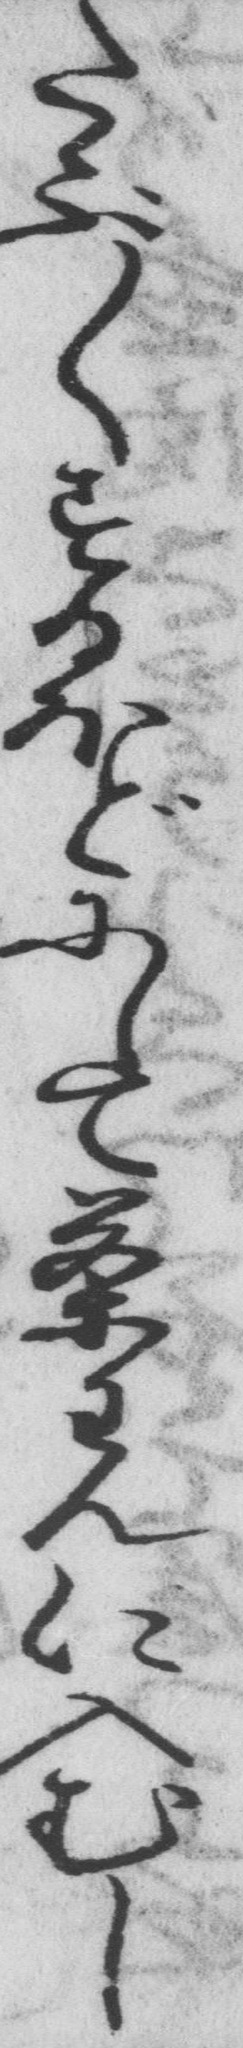たぶ〳〵するほどにして茶わんに入むし
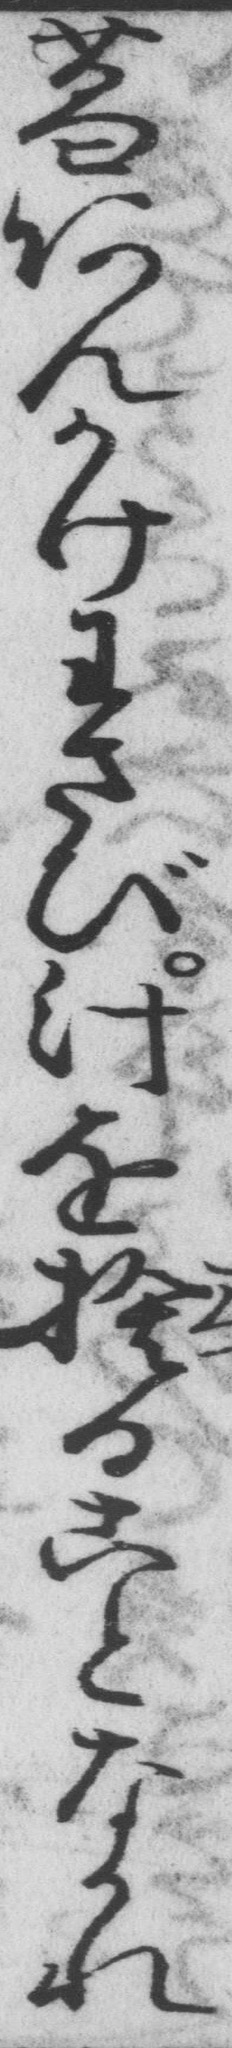葛あんかけわさび。汁を捨ることなかれ
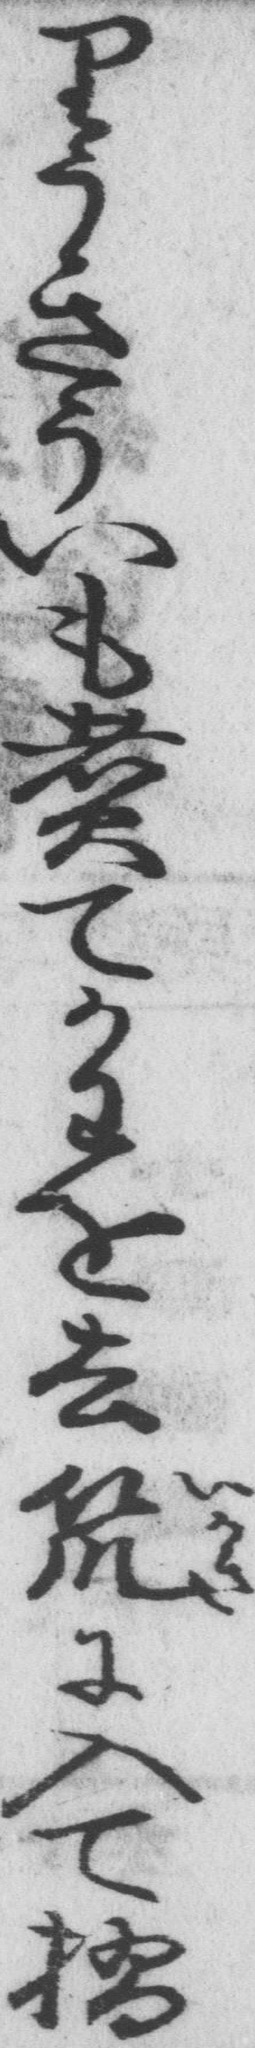りうきういも煮てかわを去笊に入て摺
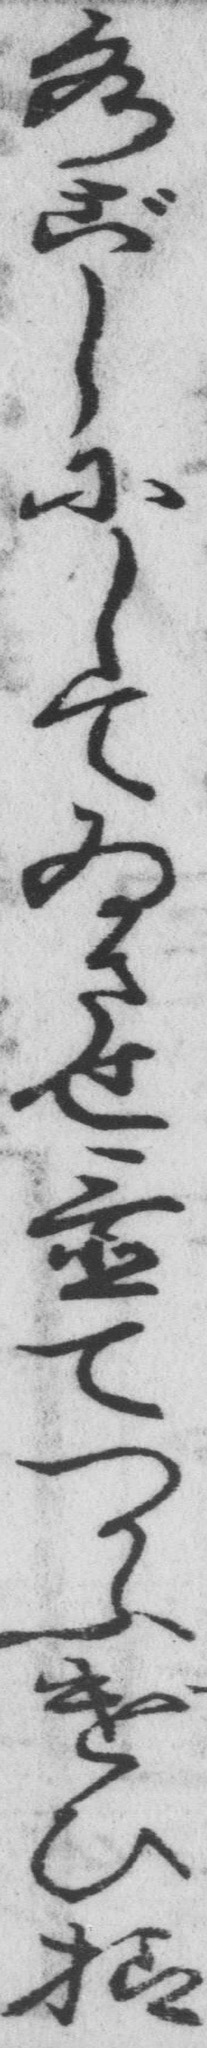水ごしにしてゐさせ置てつかふ遣ひ様
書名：料理山海郷
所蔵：大阪府立大学学術情報センター 国文学研究資料館
